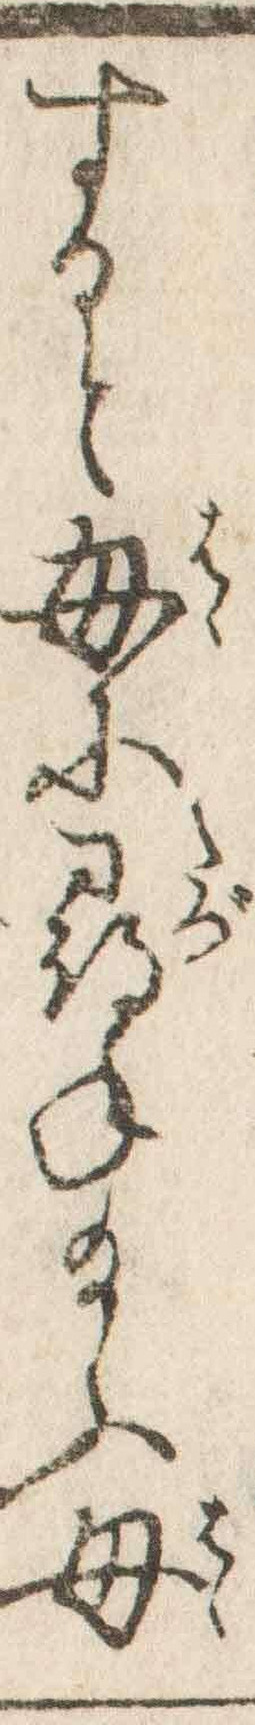すると母に尋ね給ふ母
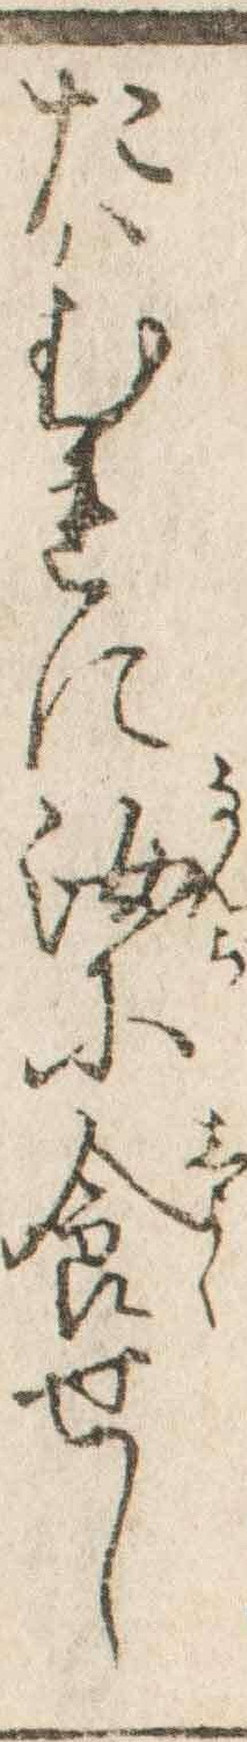たはむれに汝に食せし
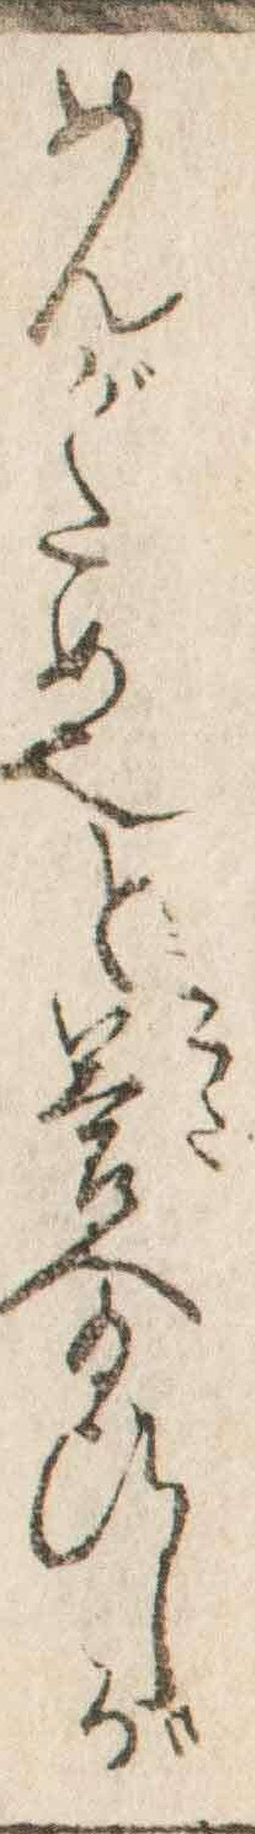めんがため也と答へ給ひしが
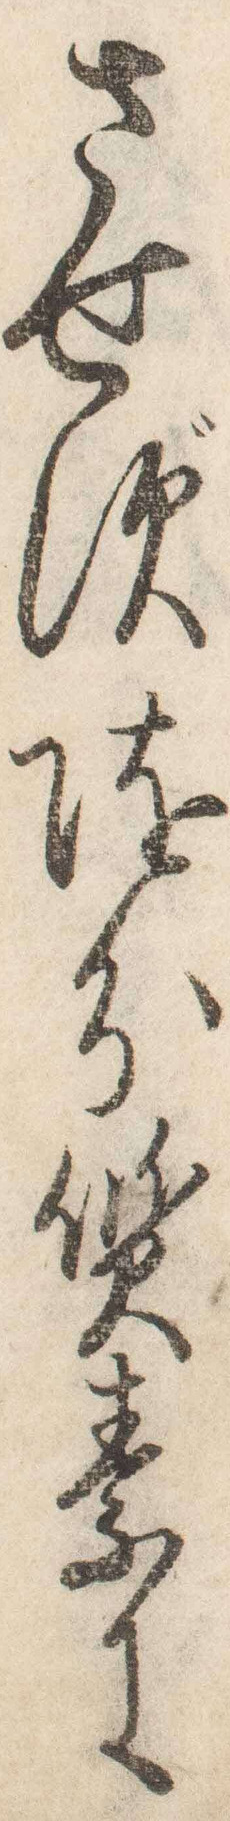させず随分質素に
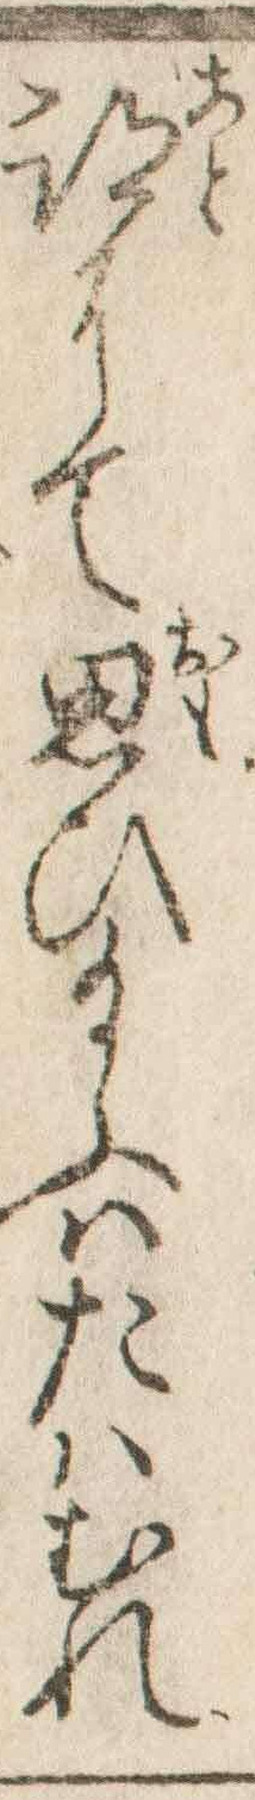跡にて思ひ給ふはたはむれ
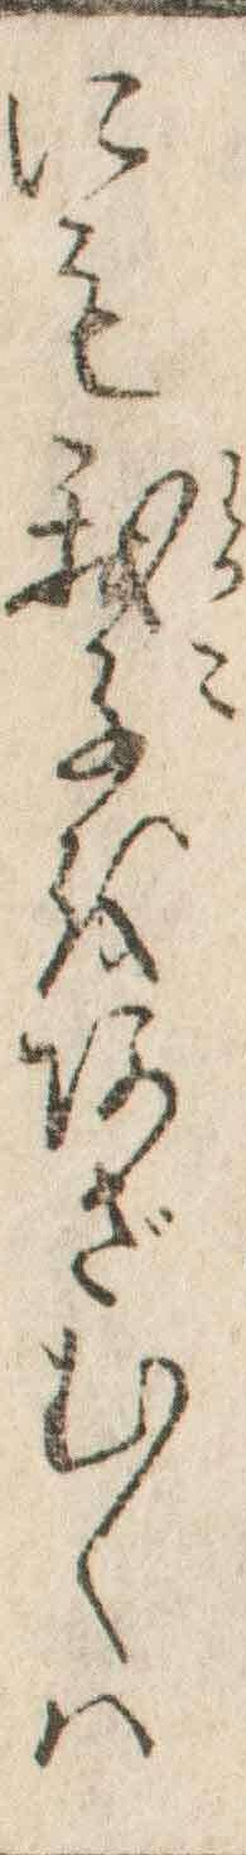にも我子をあざむくは
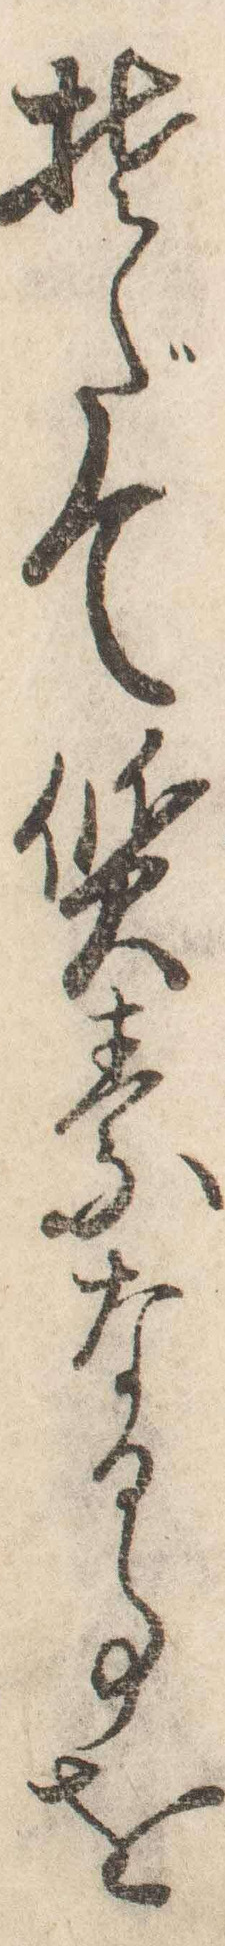そだて質素なる事を

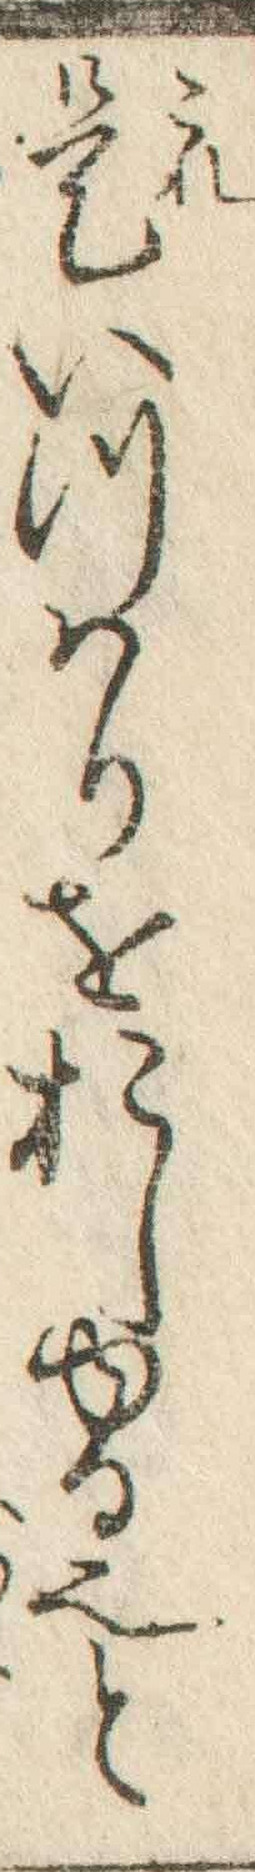是いつはりをおしゆる也と
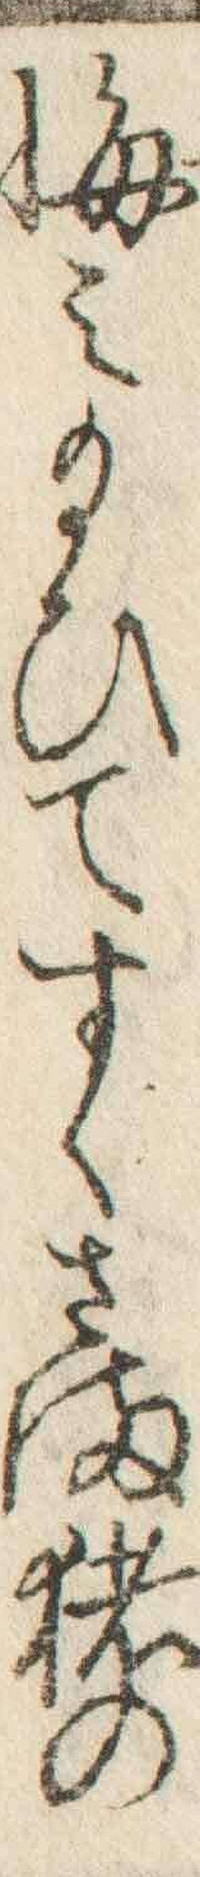悔み給ひてすくさま猪の
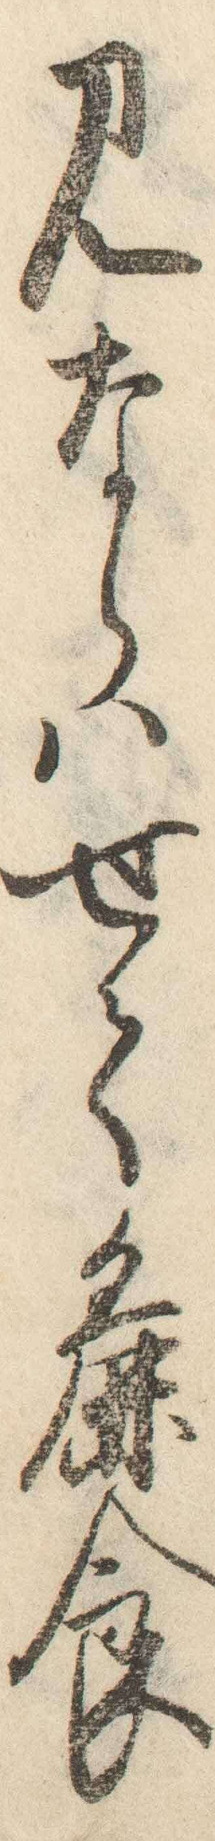見ならはせて麁食
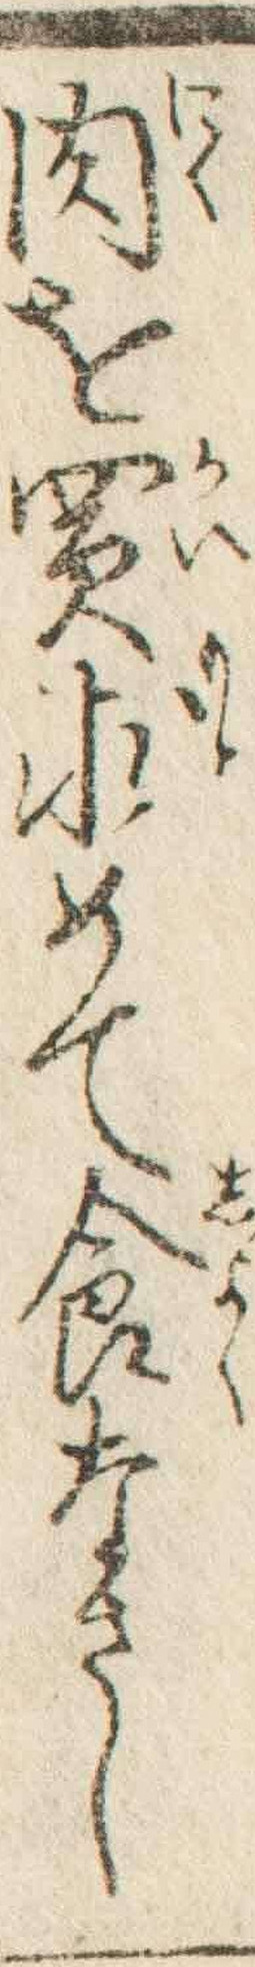肉を買求めて食なさし
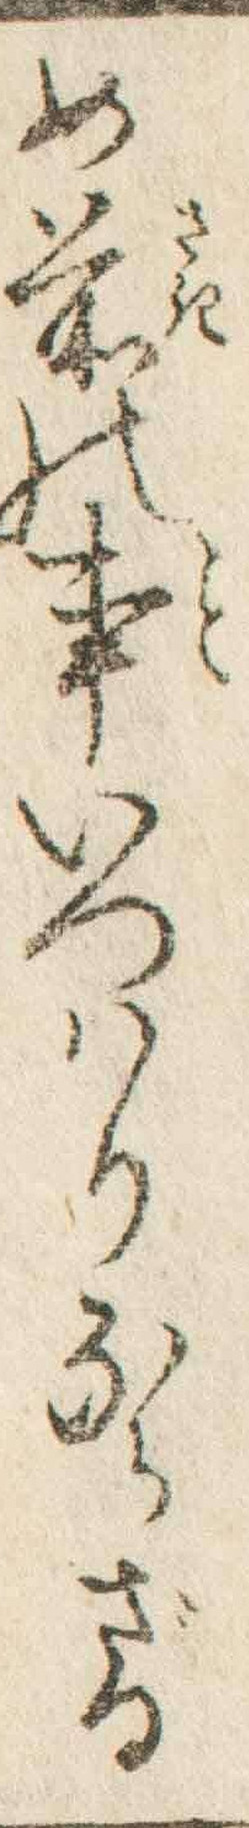め前の事いつはりならざる
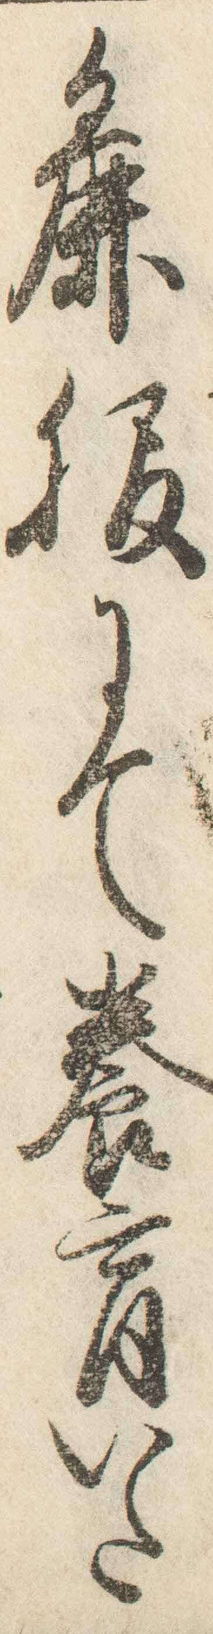麁服にて養育いた
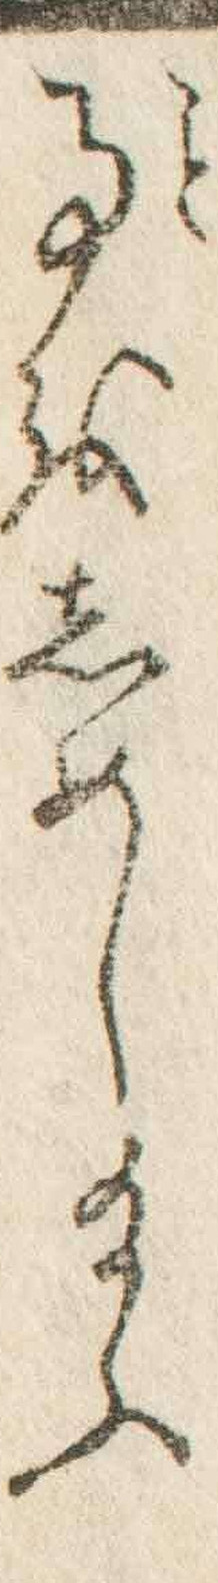事をしめし給ふ
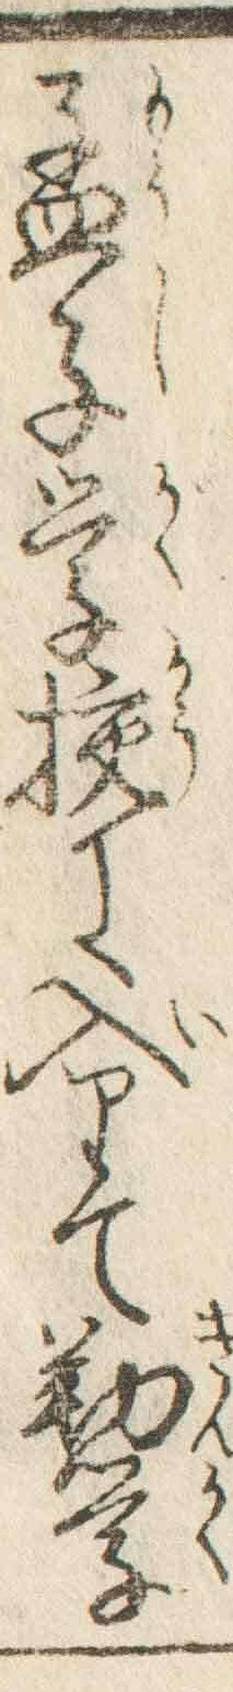孟子学校に入りて勤学
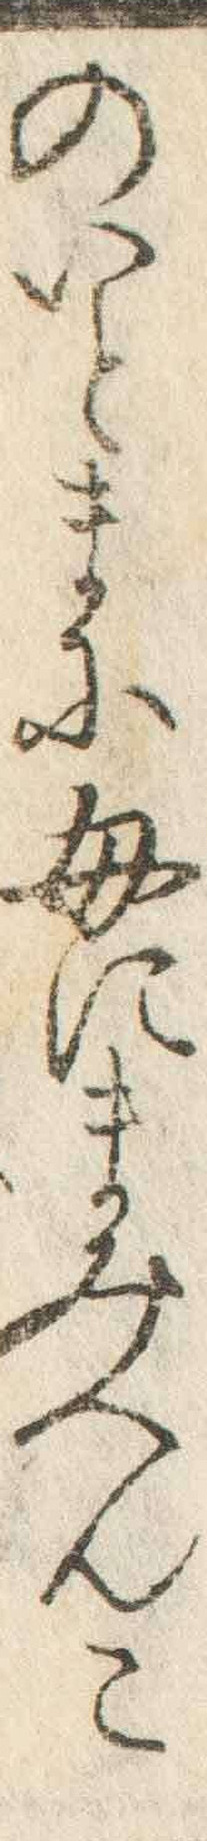のいとまに母にまみへんこ
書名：撫育草
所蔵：東京学芸大学附属図書館 国文学研究資料館
